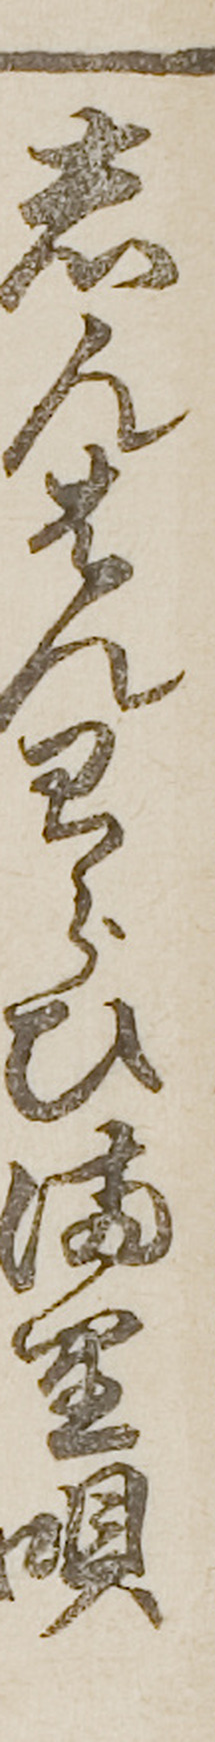しんはんわらひまり唄
